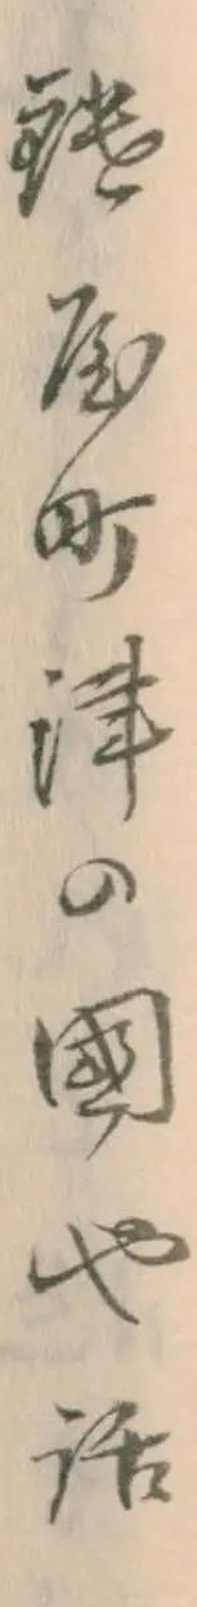鑓屋町津の国や話
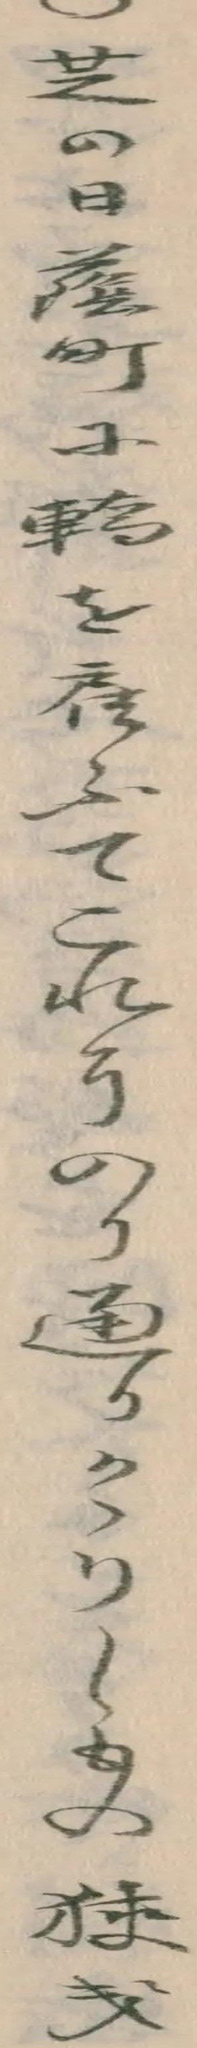〇芝の日蔭町に轎を雇ふてこれにのり通りかゝりしもの狭き
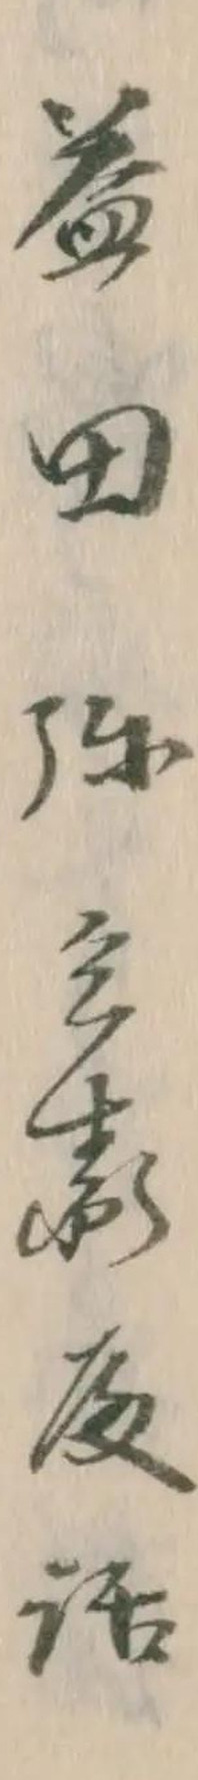益田弥兵衛殿話
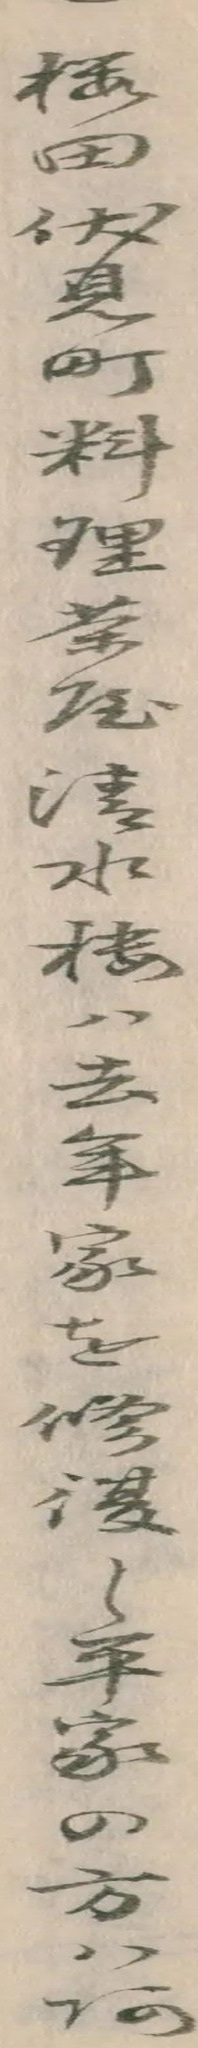〇桜田伏見町料理茶屋清水楼は去年家を修復し平家の方はあ
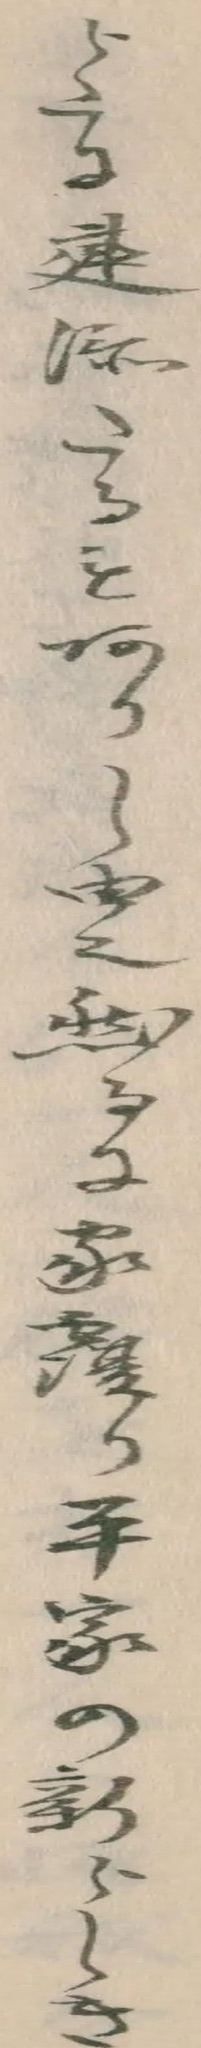らたに建添たることありし由也然るに家覆り平家の新らしき
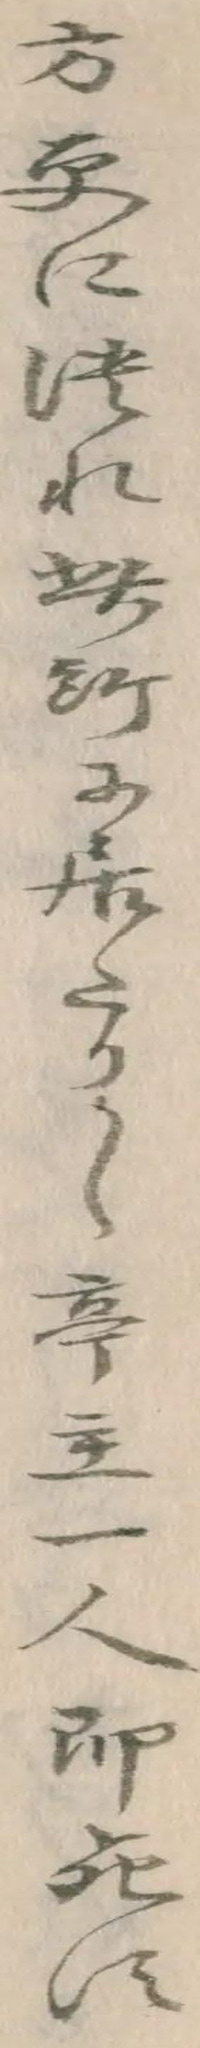方更に潰れ此所に居たりし亭主一人即死す
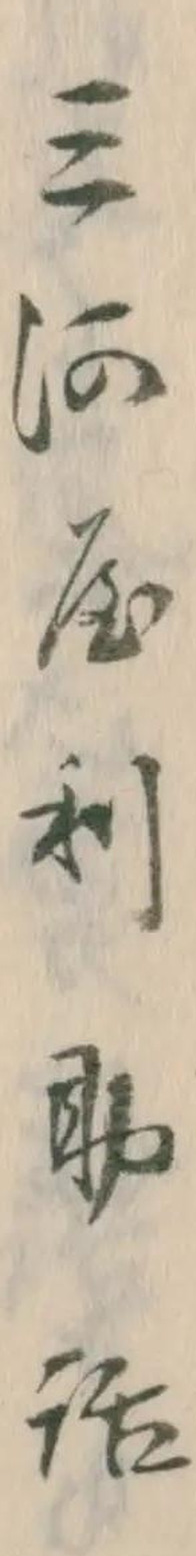三河屋利助話
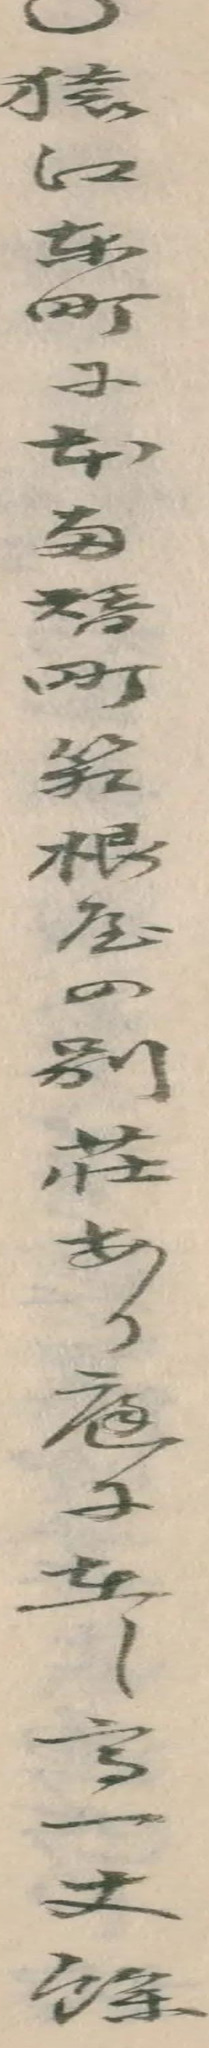〇猿江東町に本両替町箱根屋の別荘あり庭に在し高一丈余
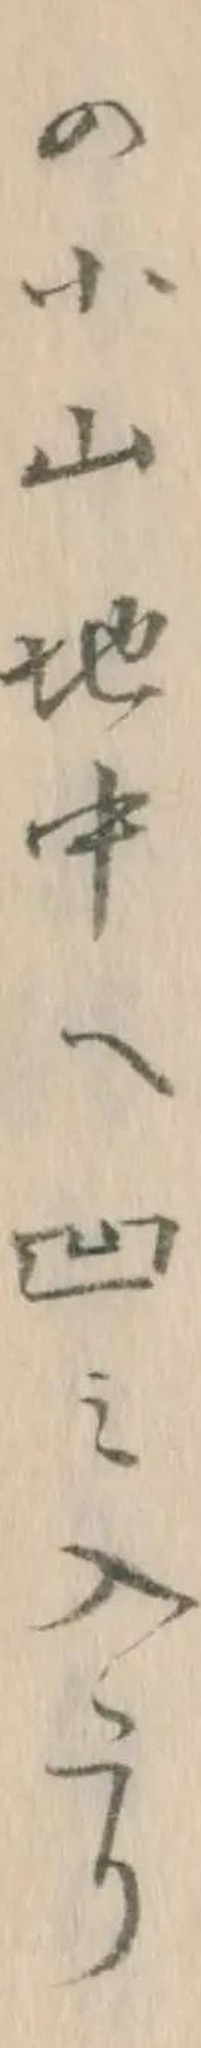の小山地中へ凹み入たり

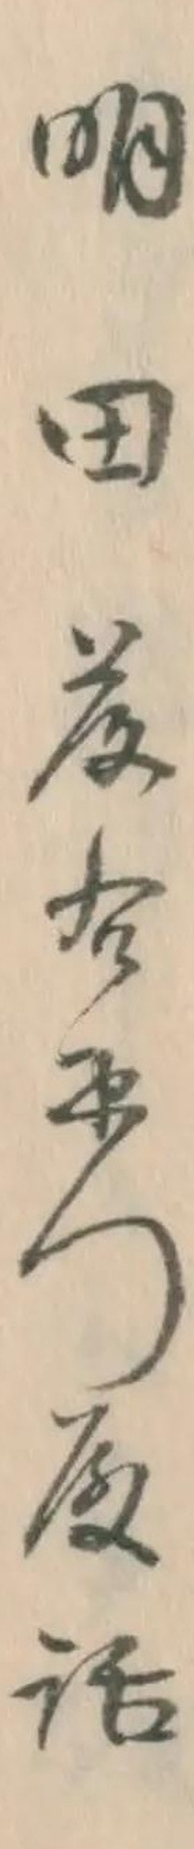明田藤右衛門殿話
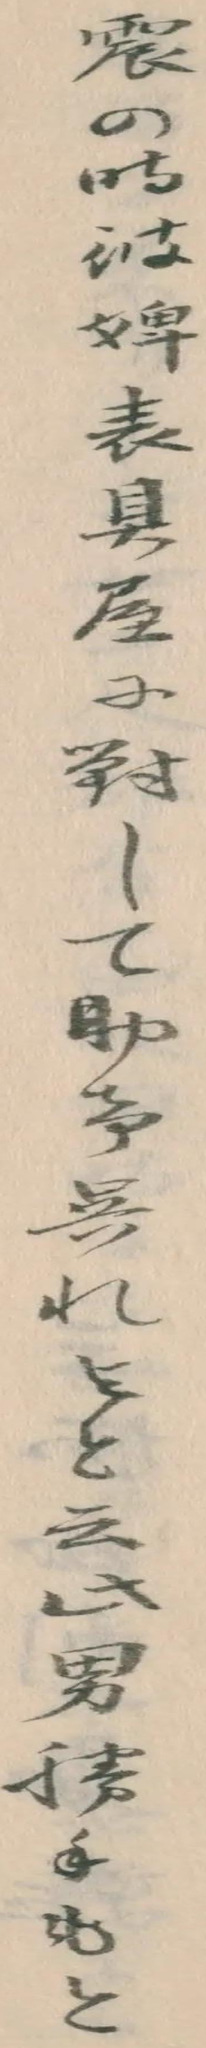震の時彼婢表具屋に対して助け呉れよと云此男勝手もと
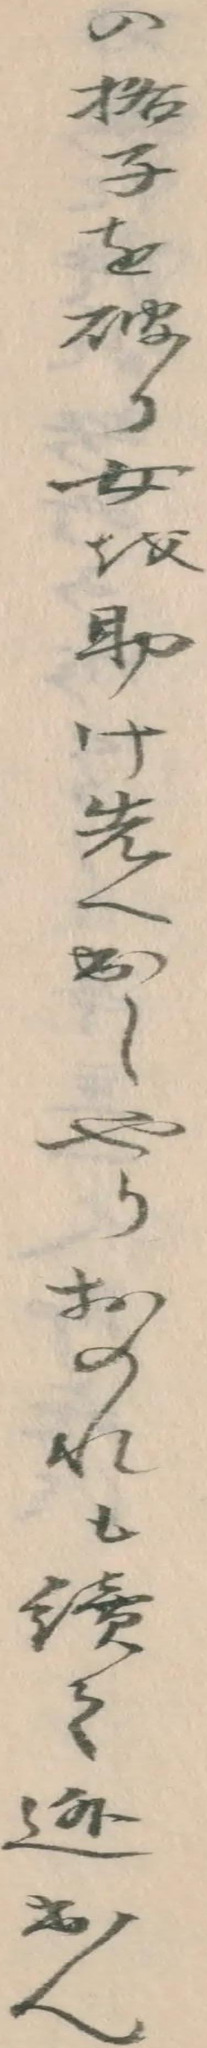の格子を破り女を助け先へ出しやりおのれも続て逃出ん
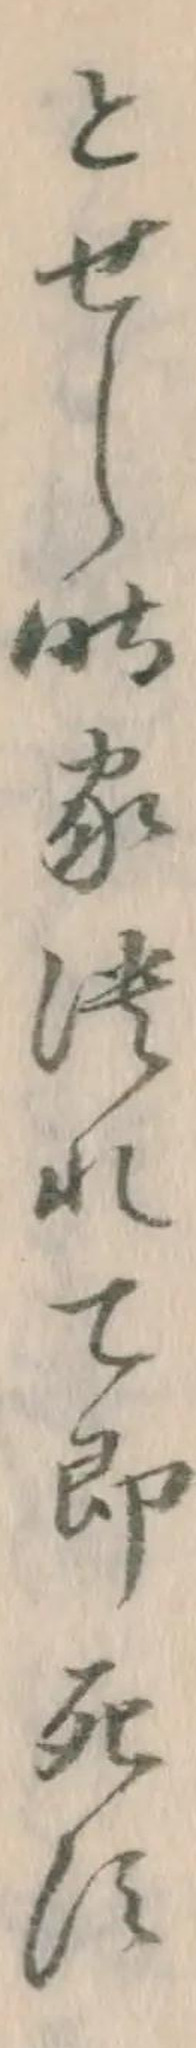とせし時家潰れて即死す
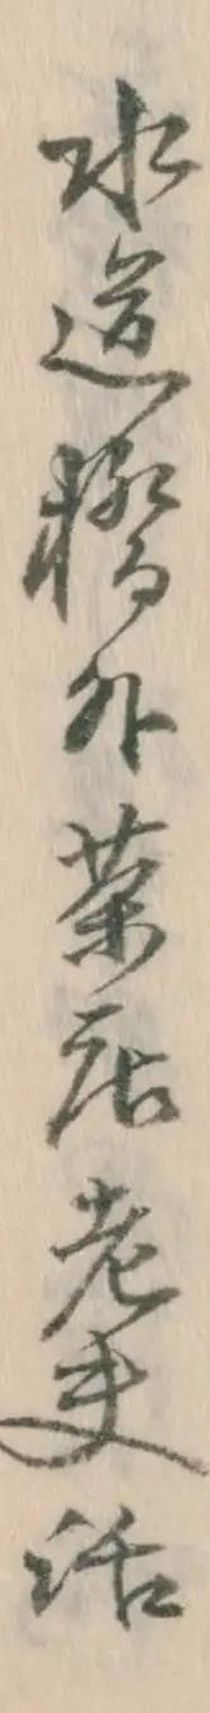水道橋外茶店老夫話
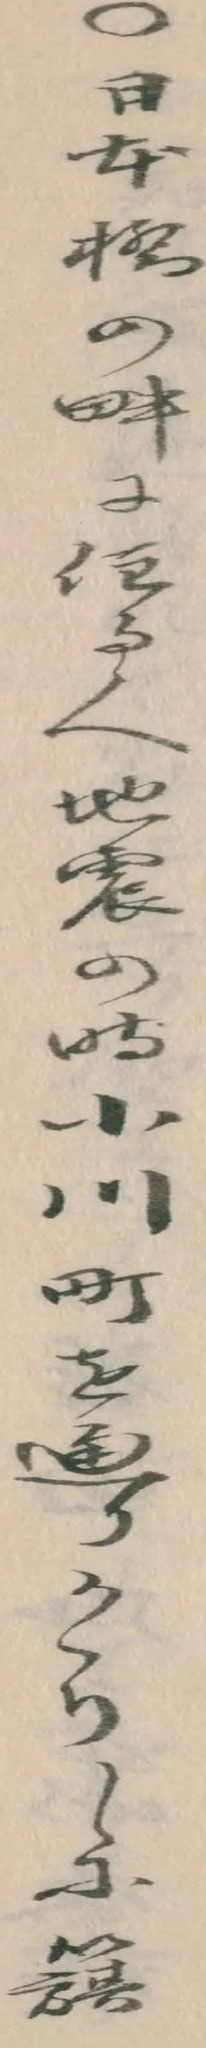〇日本橋の畔に住る人地震の時小川町を通りかゝりしに籏
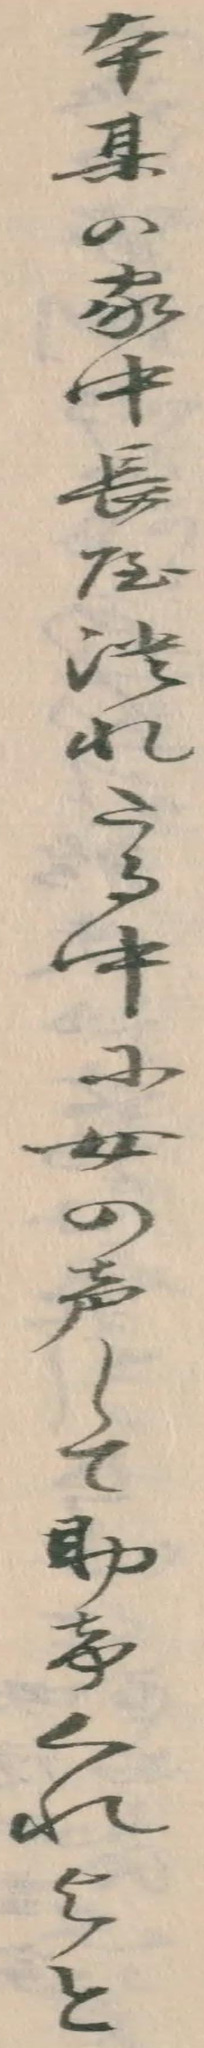本某の家中長屋潰れたる中に女の声して助けくれよと
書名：地災撮要. 巻7-9(地震之部)
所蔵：国立国会図書館 National Diet Library, JAPAN
